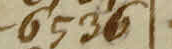6536
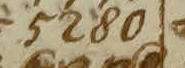5280
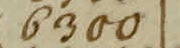6300
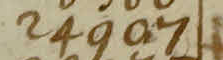24907
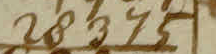28375
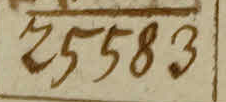25583
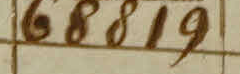68819
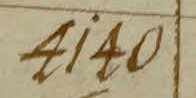4140
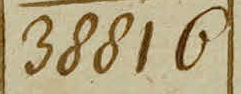38816
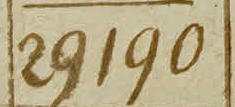29190
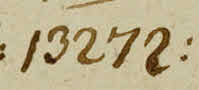13272
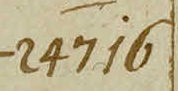24716
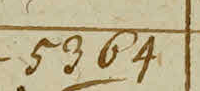5364
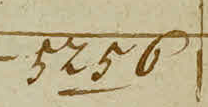5256
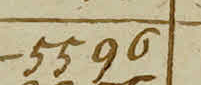5596
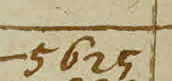5625
